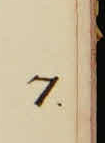7.
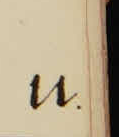11.
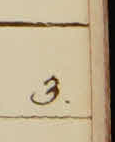3.
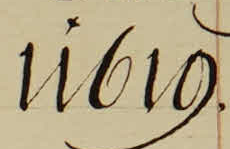11619
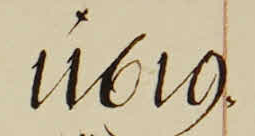11619
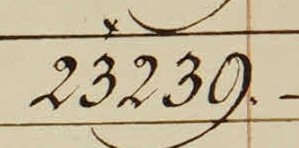23239.
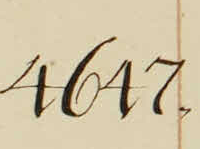4647
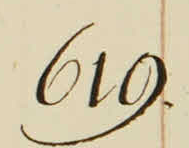619.
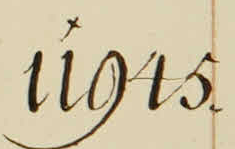11945.
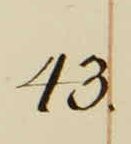43.
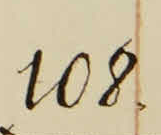108
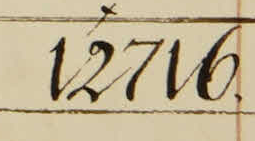12716.
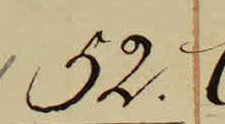52.
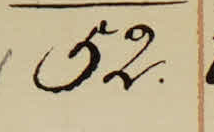52.
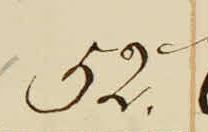52.
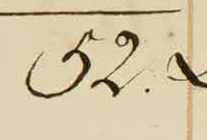52.
